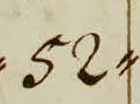52
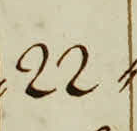22
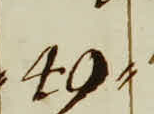49
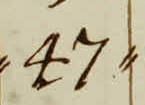47
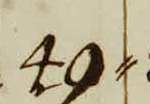49
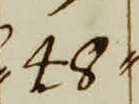48
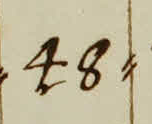48
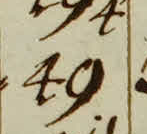49
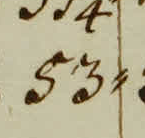53
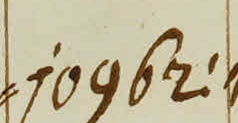10962:
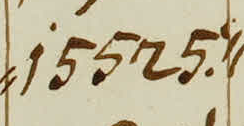15525.
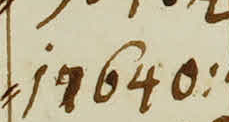17640
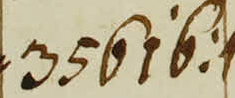35616.
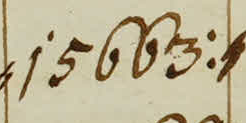15663:
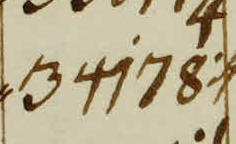34178
